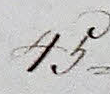45
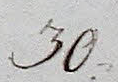30
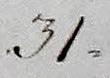31
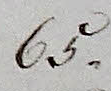65
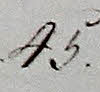45
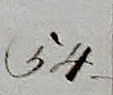54
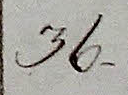36
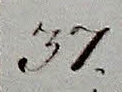37
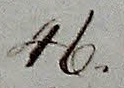46
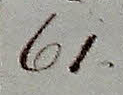61
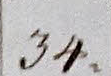34
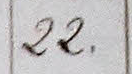22.
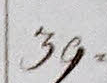39
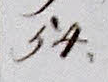54
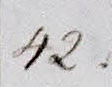42
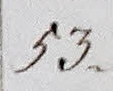53
